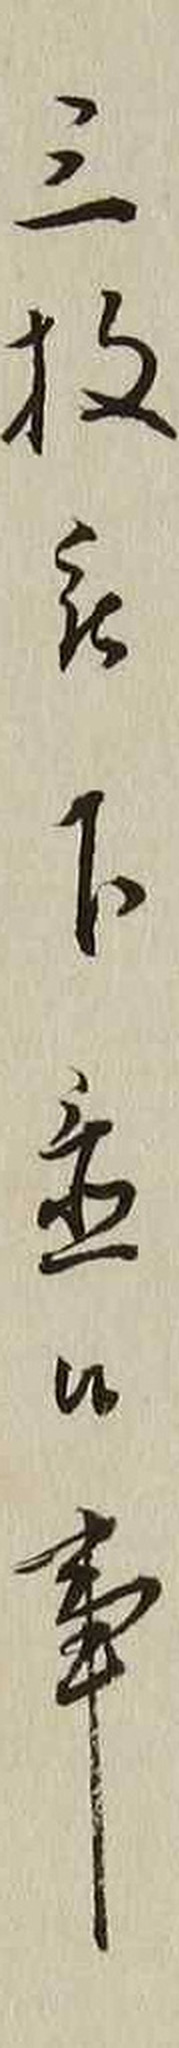三枚被下置候事
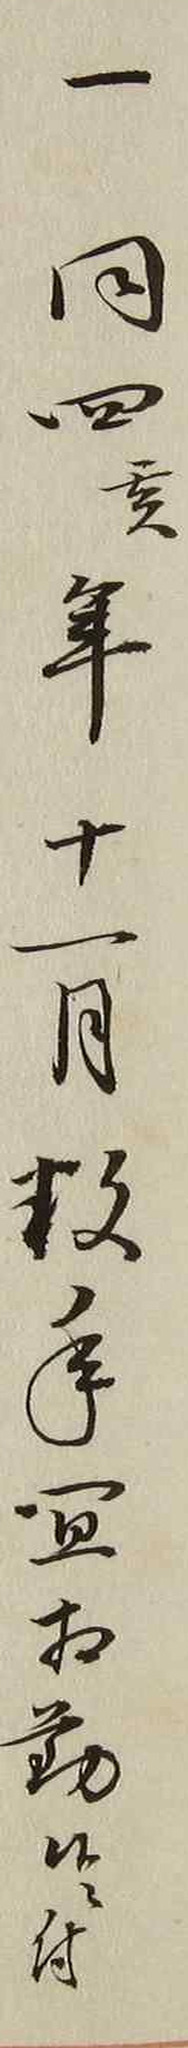一同四亥年十一月数年宜相勤候ニ付
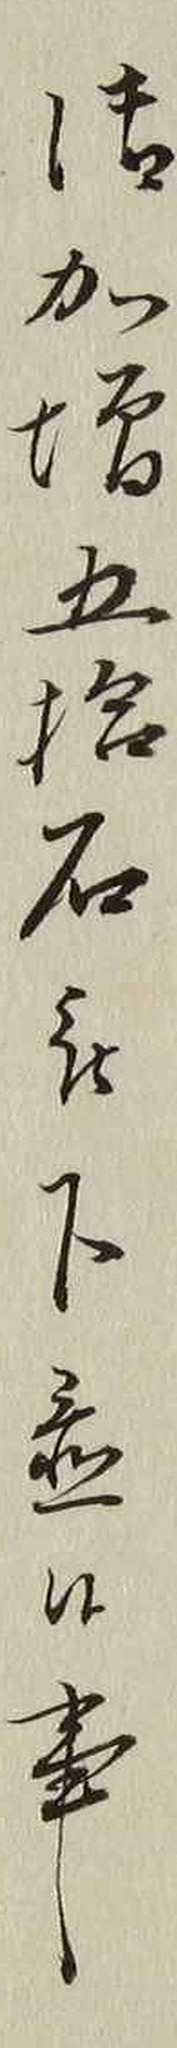御加増五拾石被下置候事
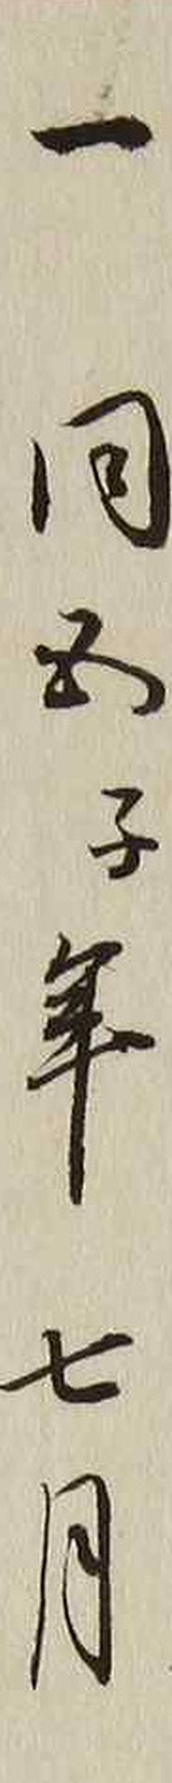一同五子年七月
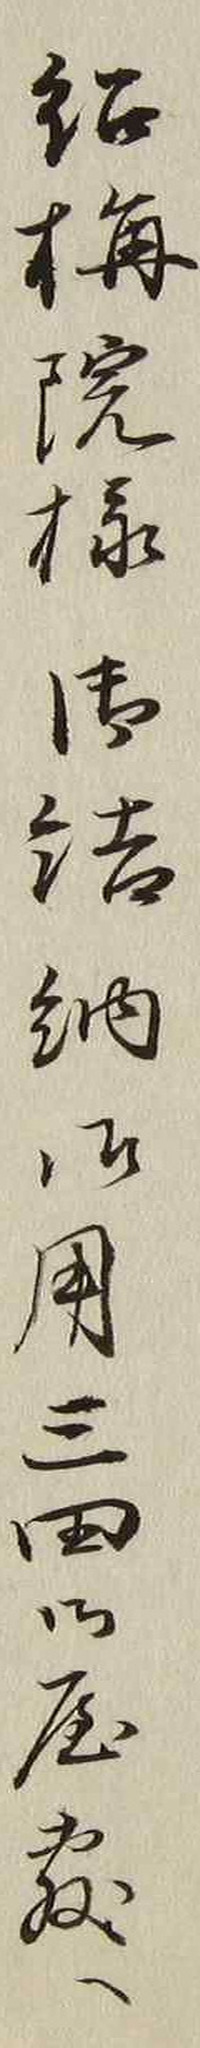紹栴院様御結納御用三田御屋敷へ
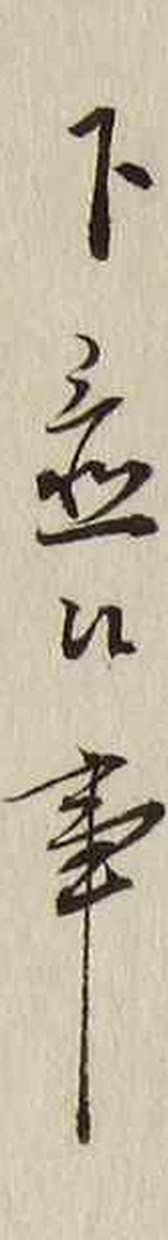下置候事
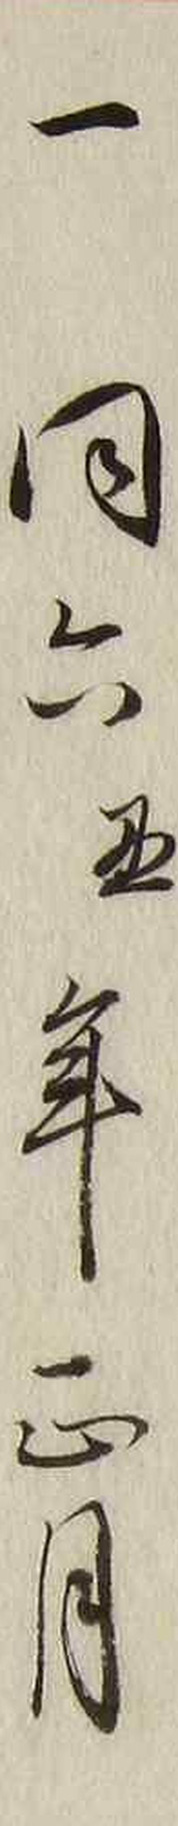一同六丑年正月
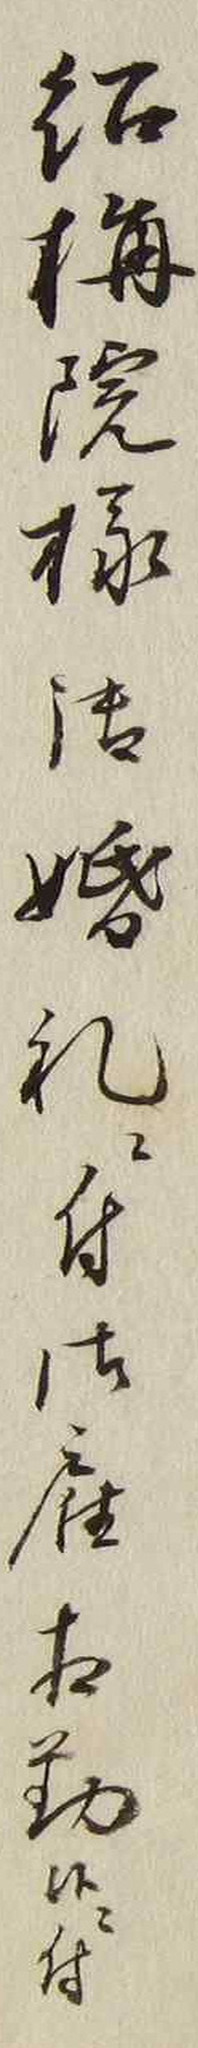紹栴院様御婚礼ニ付御雇相勤候ニ付
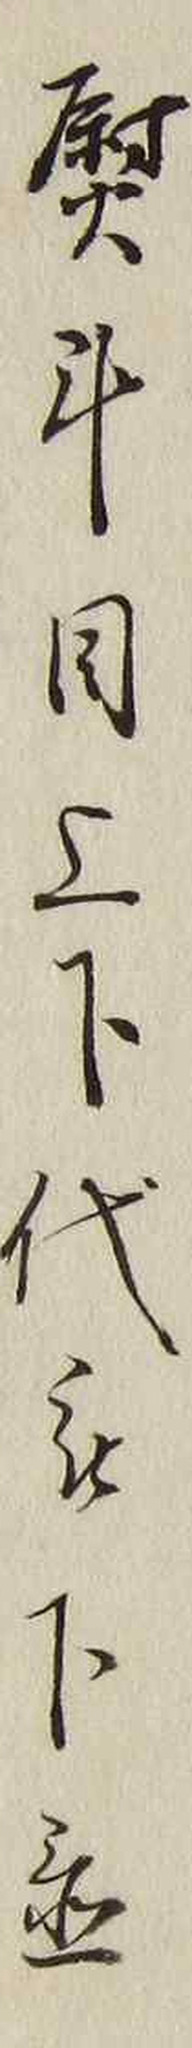熨斗目上下代被下置
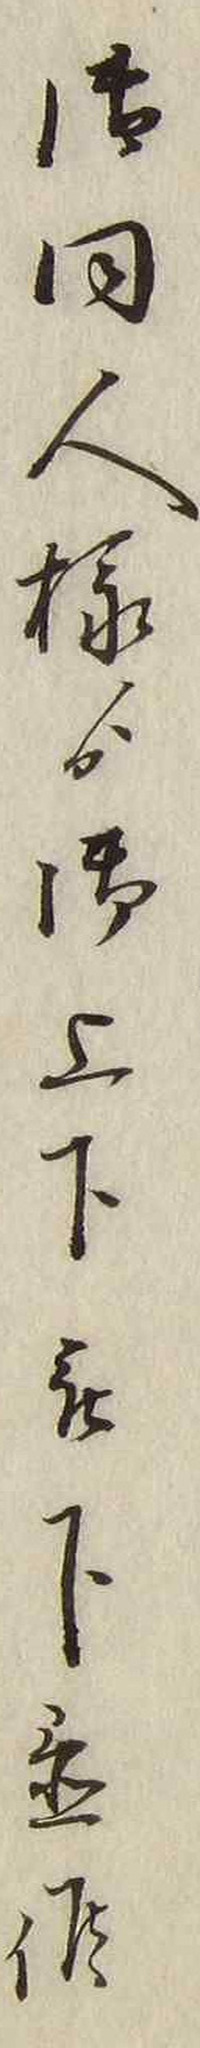御同人様ゟ御上下被下置候

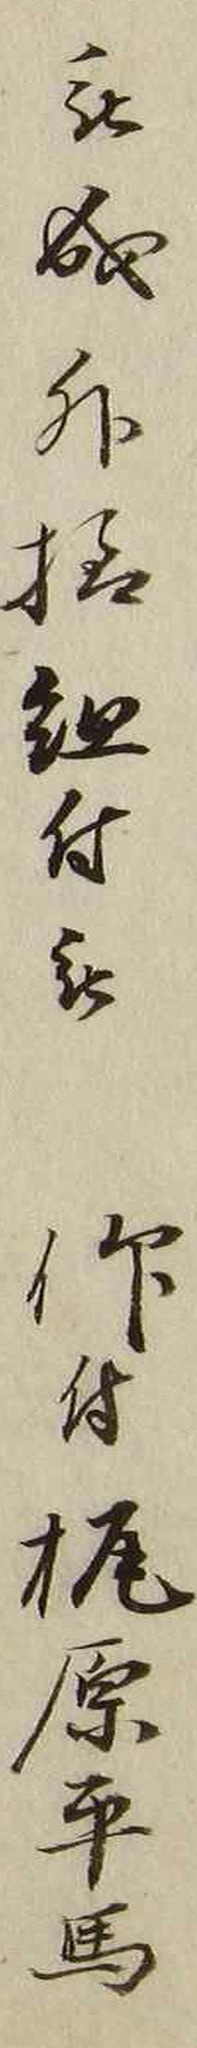被成外様組付被仰付梶原平馬
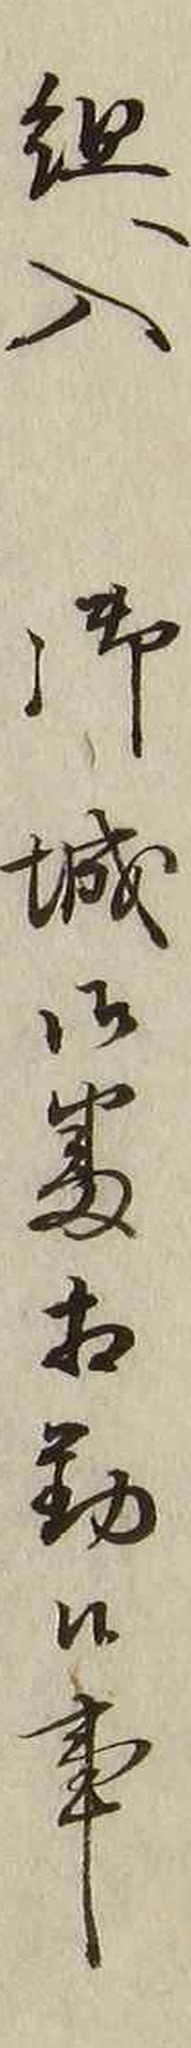組へ入御城御番相勤候事
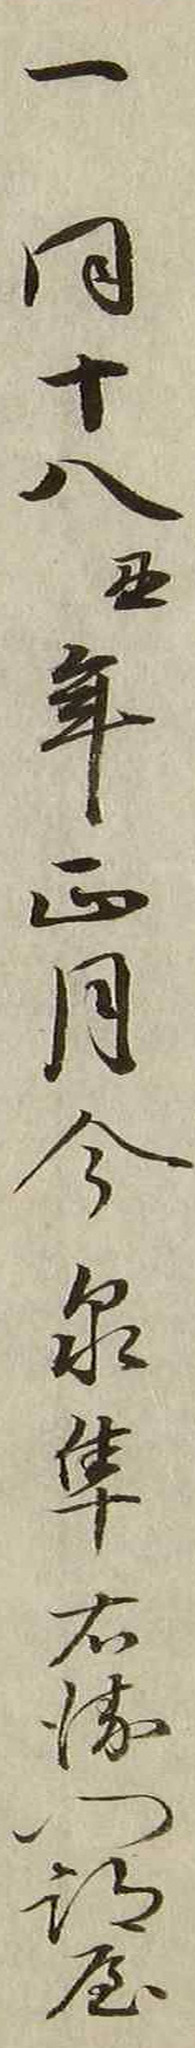一同十八丑年正月今泉隼右衛門跡屋
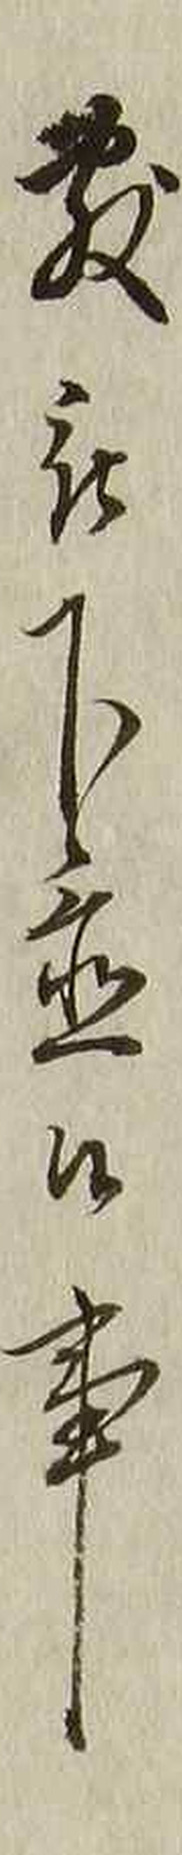敷被下置候事
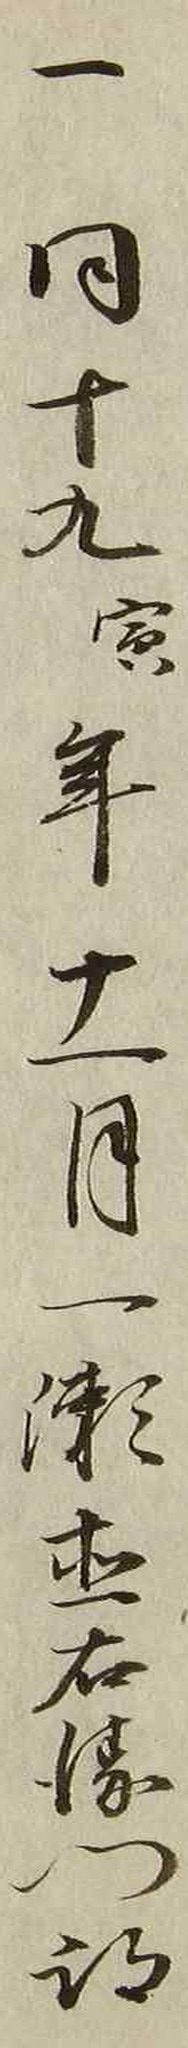一同十九寅年十一月一瀬直右衛門跡
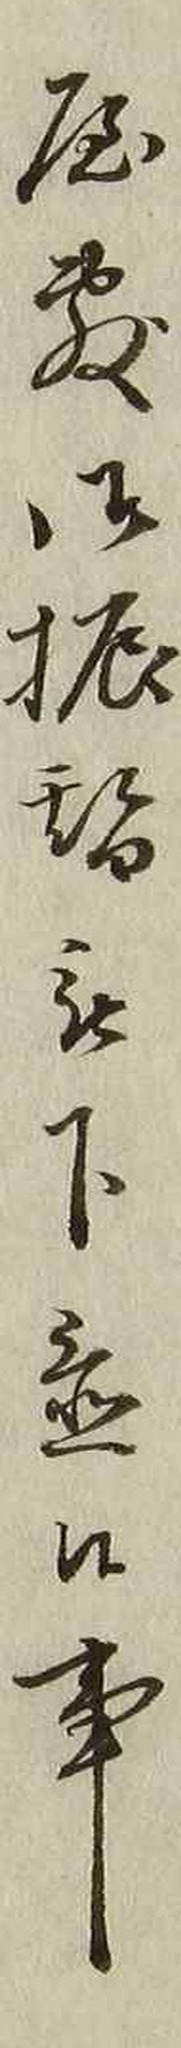屋敷御振替被下置候事
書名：諸士系譜　巻之22　い之部22
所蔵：会津若松市立会津図書館
